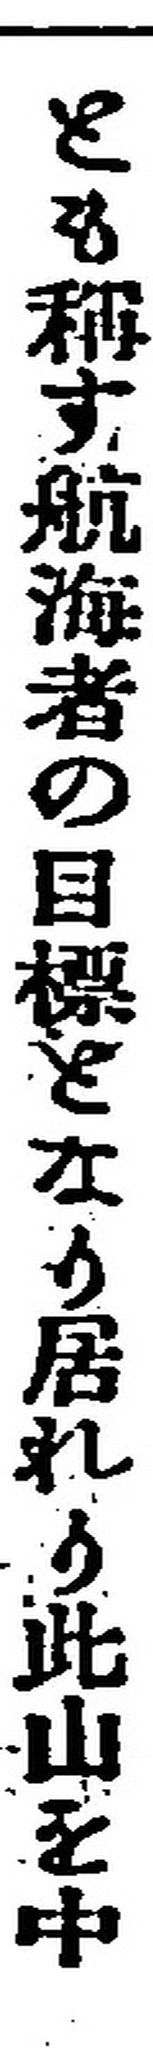とも称す航海者の目標となり居れり此山を中
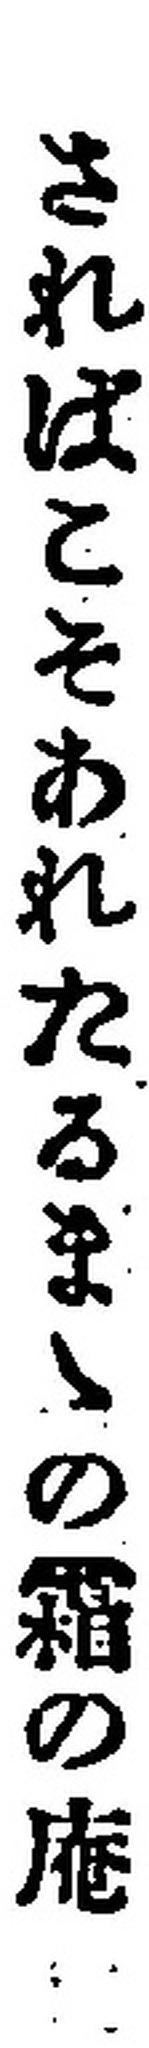さればこそあれたるまゝの霜の庵
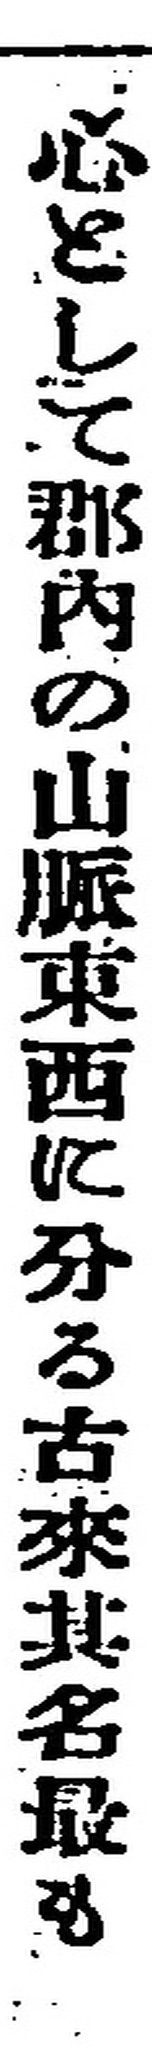心として郡内の山脈東西に分る古来其名最も
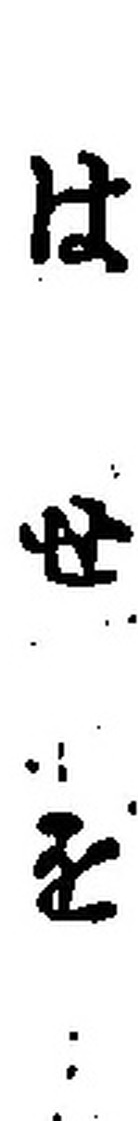はせを
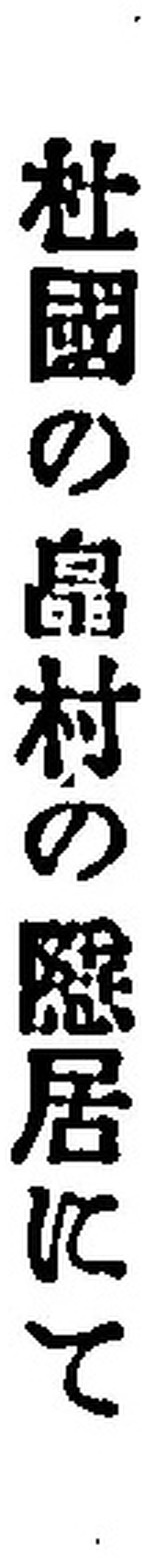杜国の畠村の隠居にて
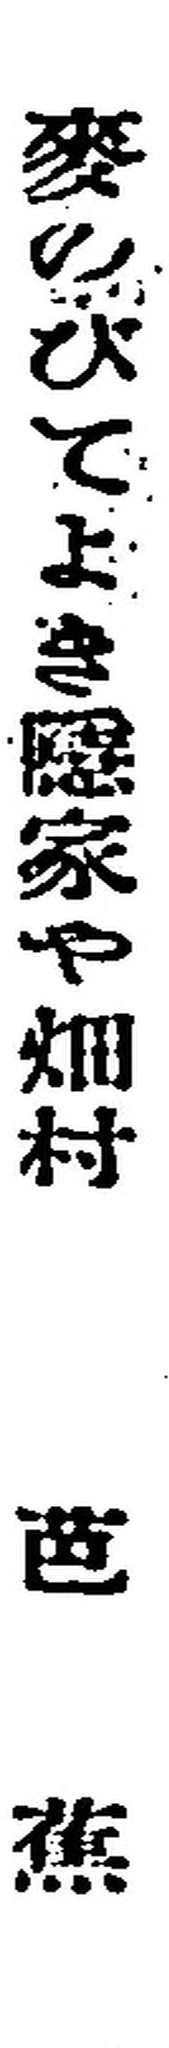麦のびてよき隠家や畑村芭蕉
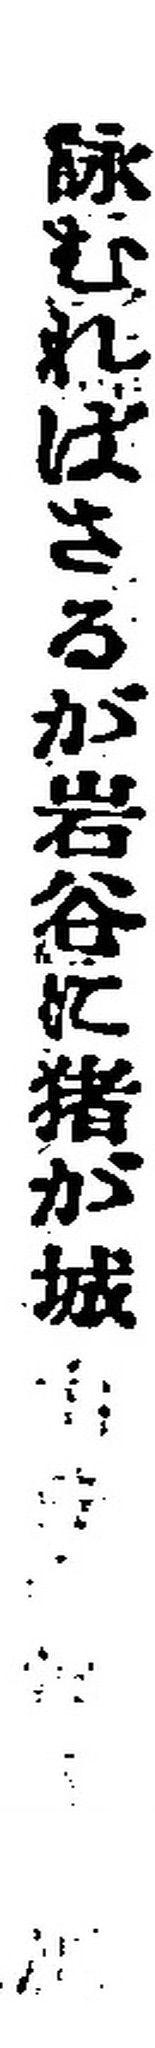詠むればさるが岩谷に猪が城
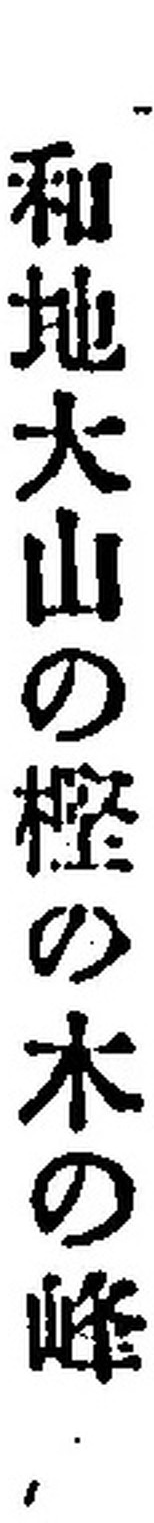和地大山の樫の木の峰
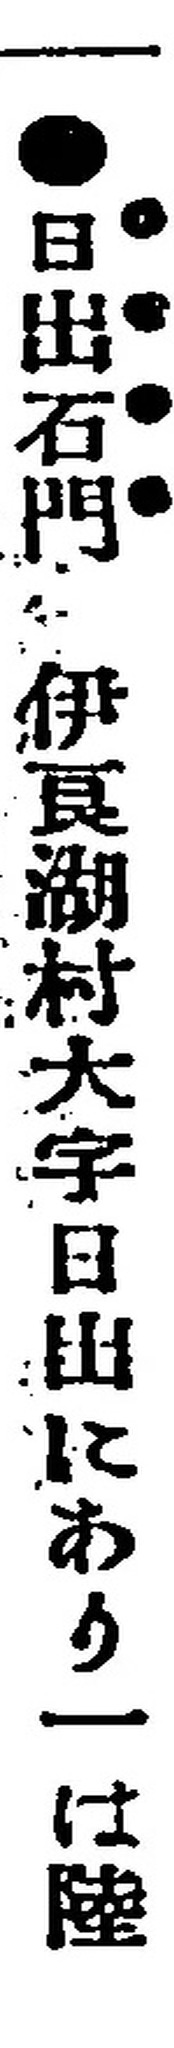●日出石門伊良湖村大字日出にあり一は陸
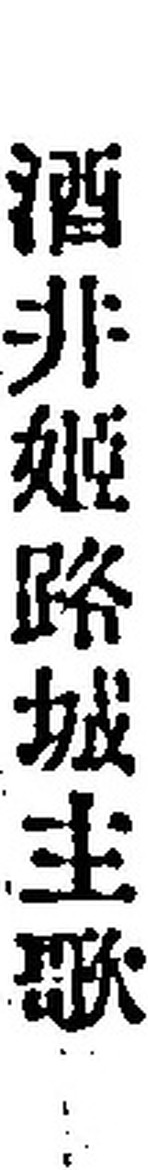酒井姫路城主歌
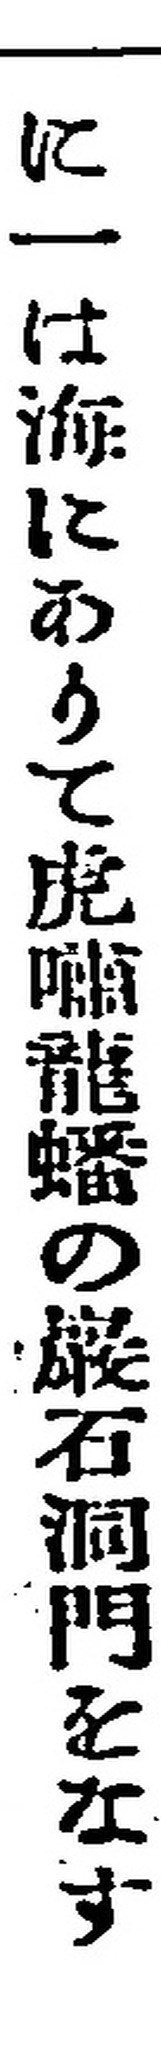に一は海にありて虎嘯龍蟠の巌石洞門をなす
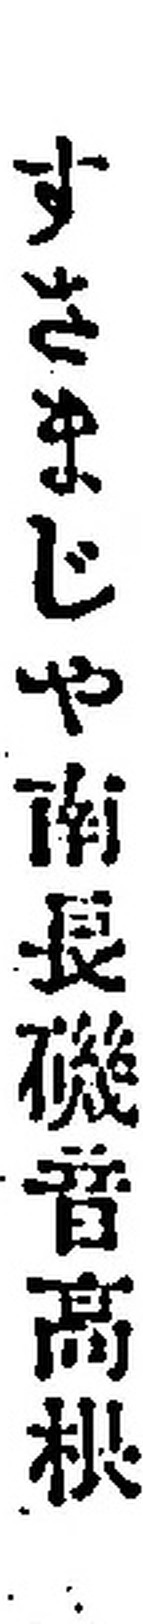すさまじや南長磯音高根
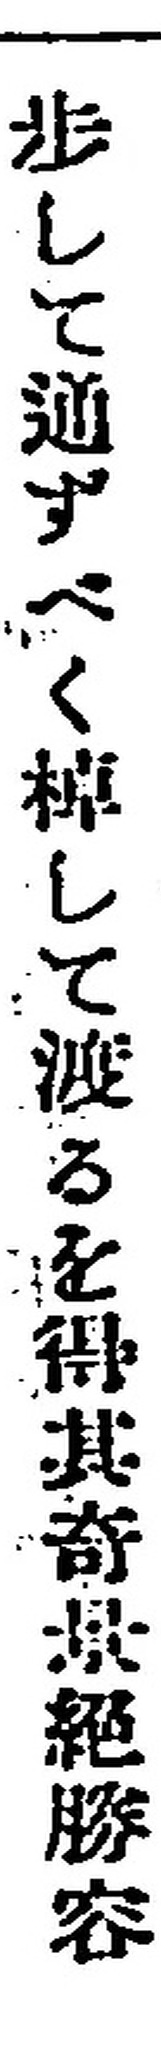歩して通ずべく棹して渡るを得其奇景絶勝容
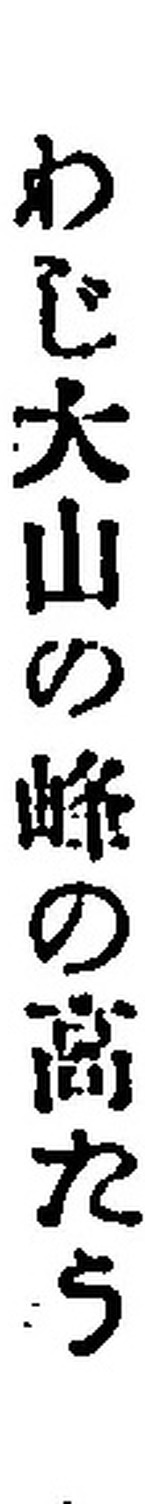わじ大山の峰の高たう
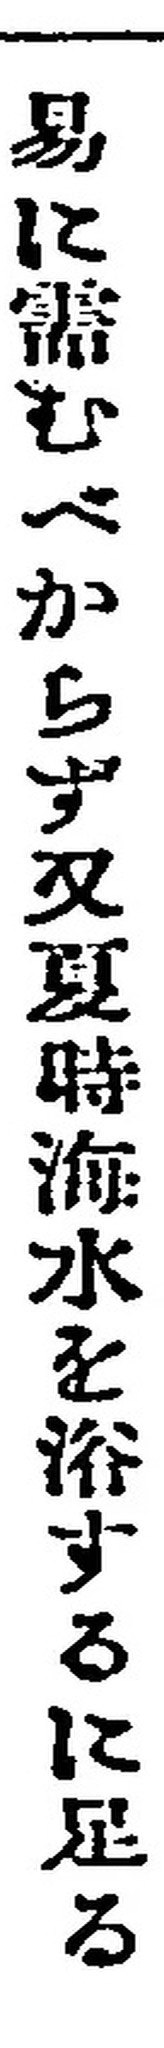易に需むべからず又夏時海水を浴するに足る
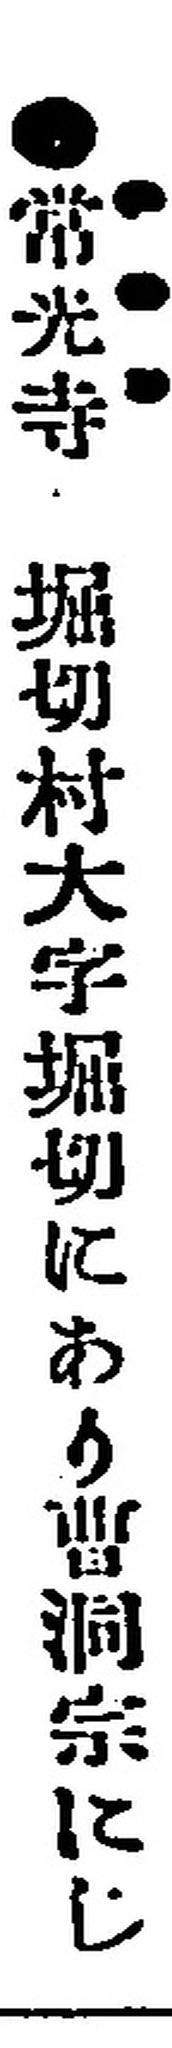●常光寺堀切村大字堀切にあり曹洞宗にし
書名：東参名勝案内
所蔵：国立国会図書館 National Diet Library, JAPAN
